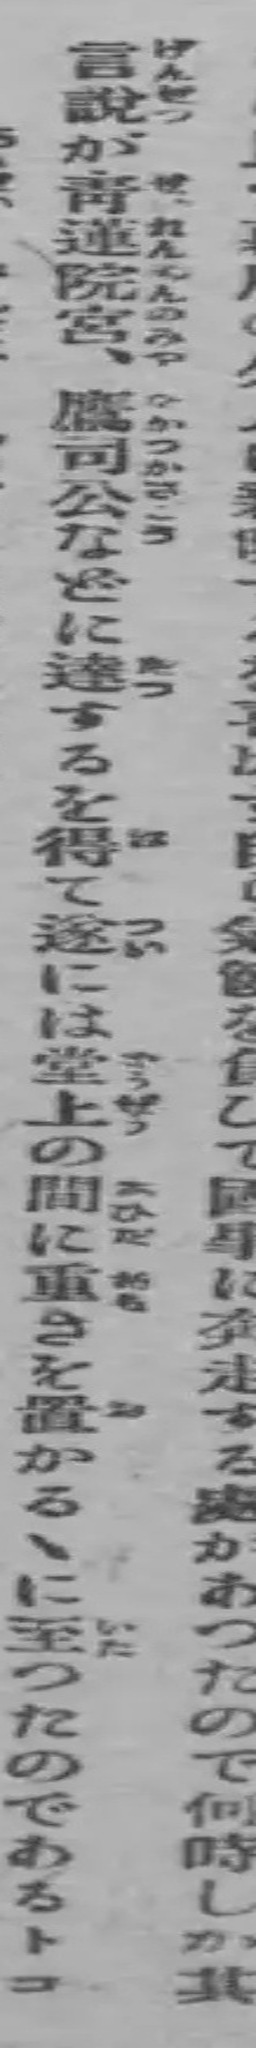言説が青蓮院宮、鷹司公などに達するを得て遂には堂上の間に重きを置かるゝに至つたのであるトコ
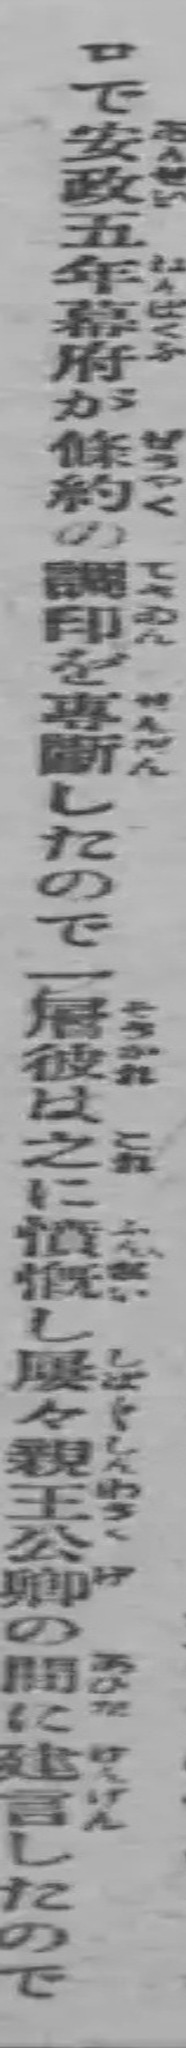ロで安政五年幕府が条約の調印を専断したので一層彼は之に憤慨し屡々親王公卿の間に建言したので
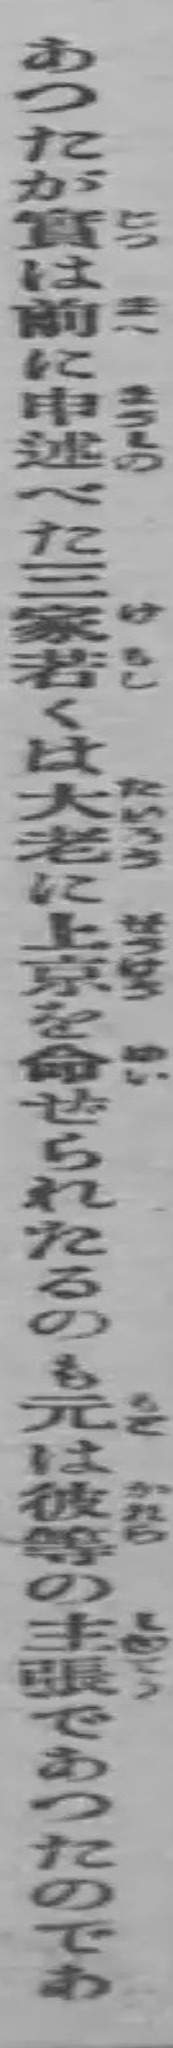あつたが実は前に申述べた三家若くは大老に上京を命ぜられたるのも元は彼等の主張であつたのであ
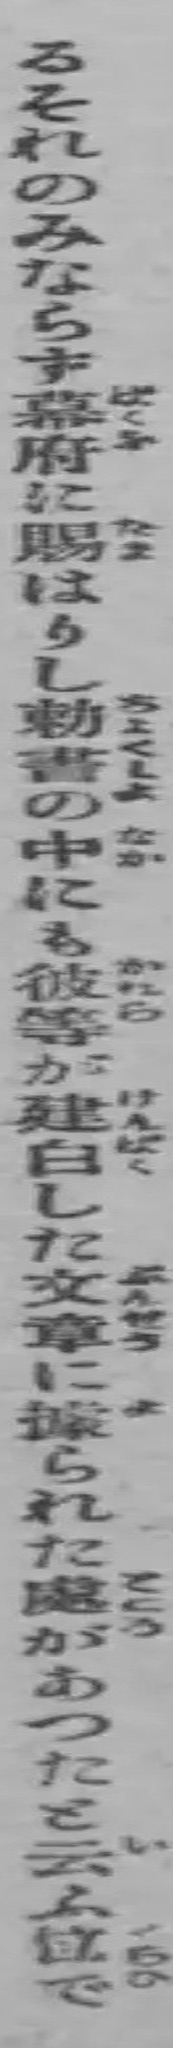るそれのみならず幕府に賜はりし勅書の中にも彼等が建白した文章に拠られた処があつたと云ふ位で
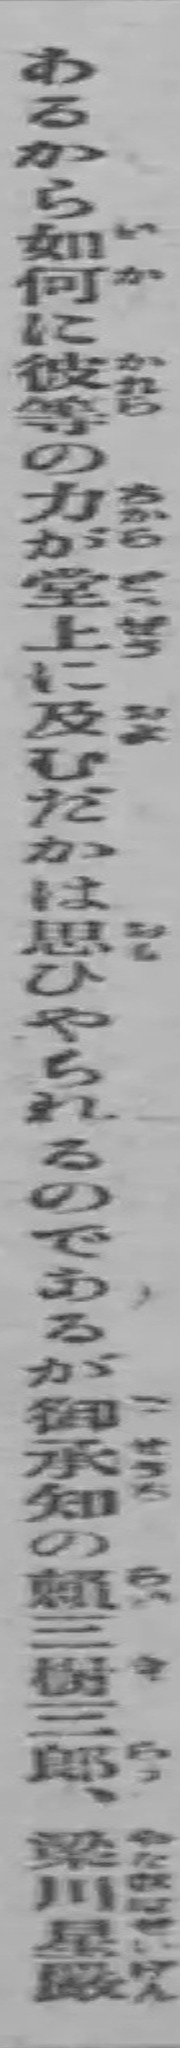あるから如何に彼等の力が堂上に及むだかは思ひやられるのであるが御承知の頼三樹三郎、梁川星厳
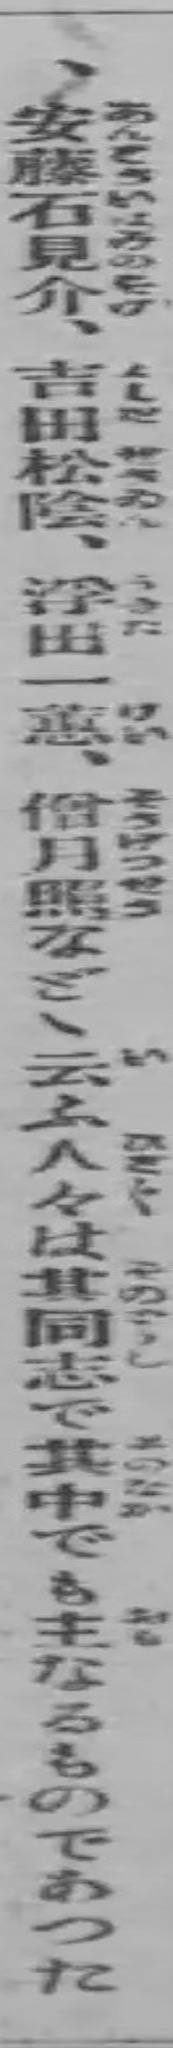、安藤石見介、吉田松陰、浮田一恵、僧月照などゝ云ふ人々は其同志で其中でも主なるものであつた
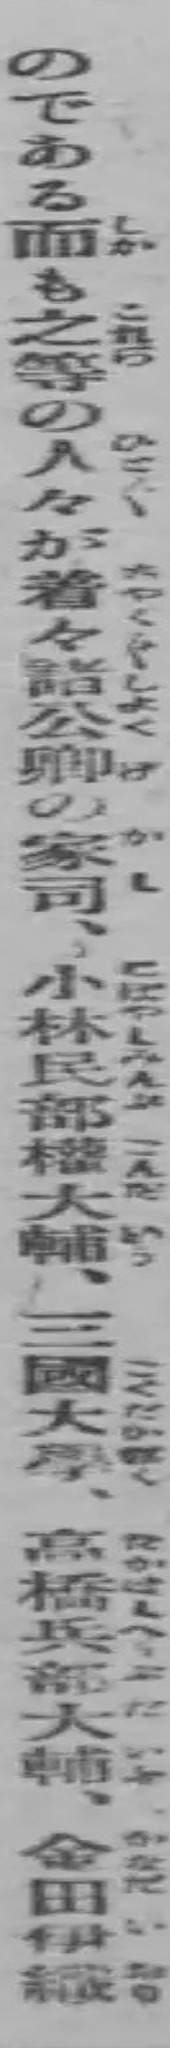のである而も之等の人々が着々諸公卿の家司、小林民部権大輔、三国大学、高橋兵部大輔、金田伊織
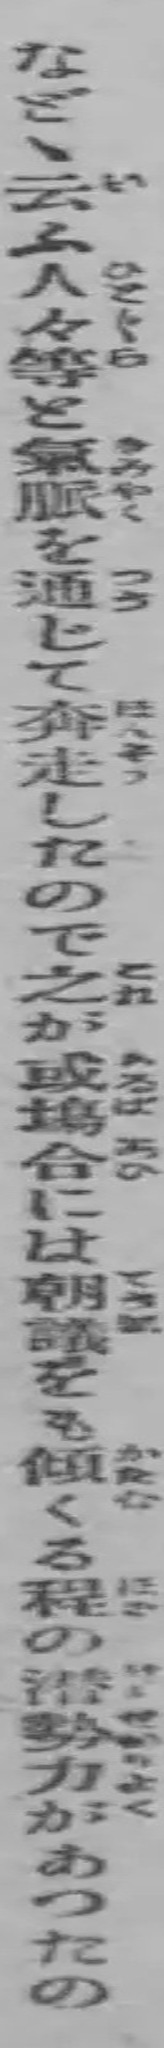などゝ云ふ人々等と気脈を通じて奔走したので之が或場合には朝議をも傾くる程の潜勢力があつたの
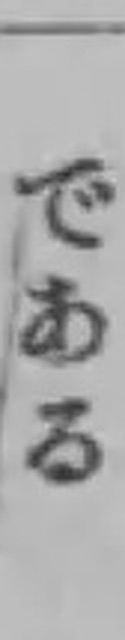である
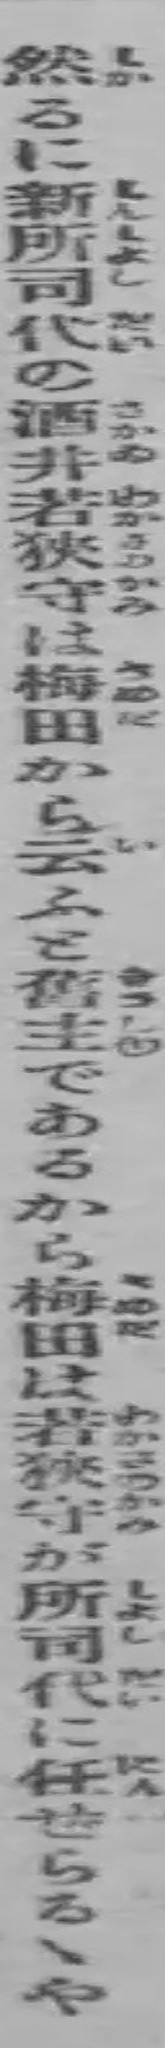然るに新所司代の酒井若狭守は梅田から云ふと旧主であるから梅田は若狭守が所司代に任ぜらるゝや
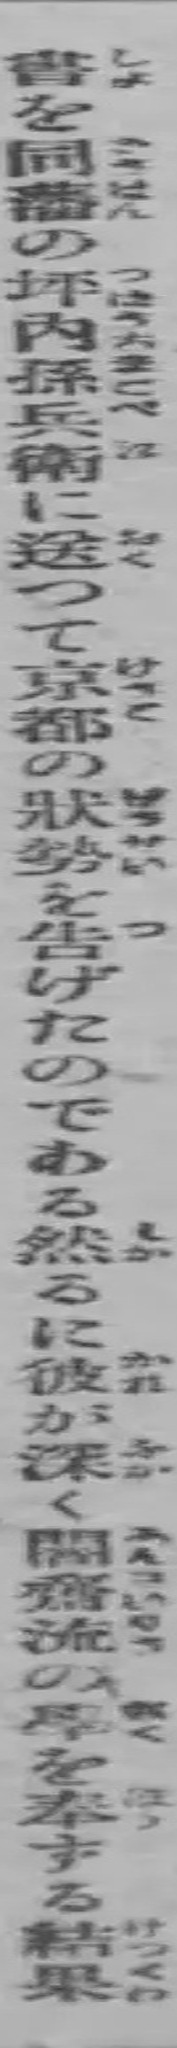書を同藩の坪内孫兵衛に送つて京都の状勢を告げたのである然るに彼が深く闇斎流の学を奉ずる結果
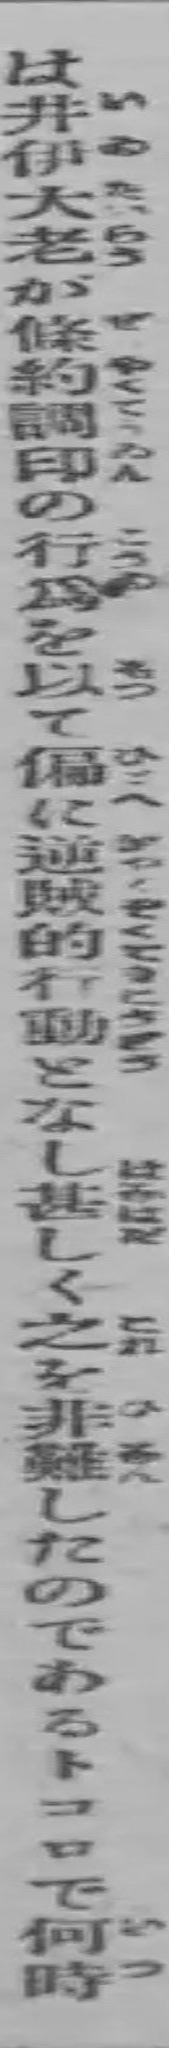は井伊大老が条約調印の行為を以て偏に逆賊的行動となし甚しく之を非難したのであるトコロで何時
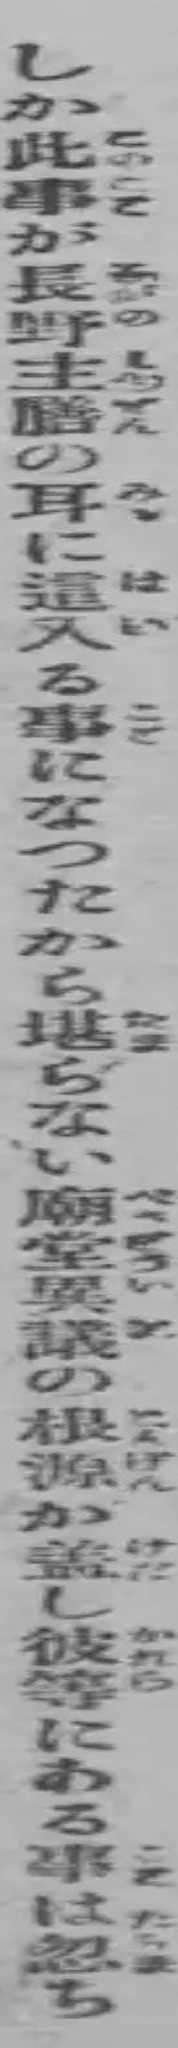しか此事が長野主膳の耳に這入る事になつたから堪らない廟堂異議の根源か蓋し彼等にある事は忽ち
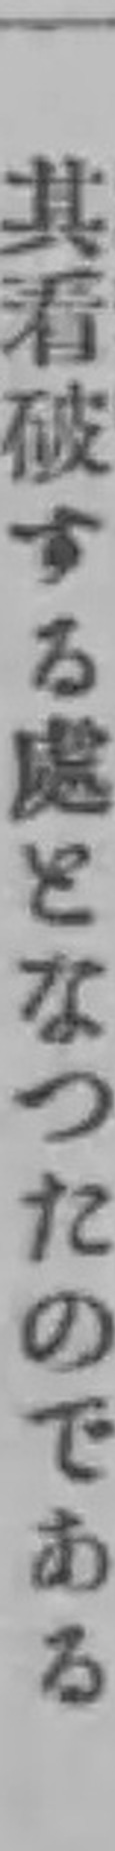其看破する処となつたのである
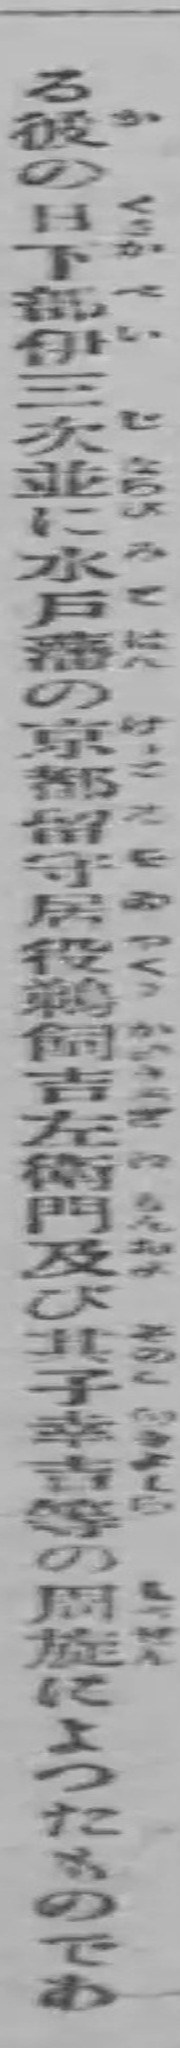る彼の日下部伊三次並に水戸藩の京都留守居役鵜飼吉左衛門及び其子幸吉等の周旋によつたものであ
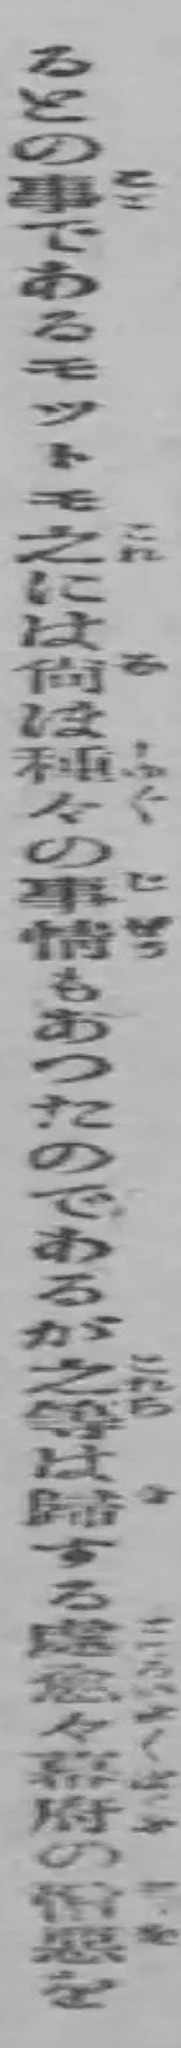るとの事であるモツトモ之には尚ほ種々の事情もあつたのであるが之等は帰する処愈々幕府の憎悪を
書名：豊橋市史談
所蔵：国立国会図書館 National Diet Library, JAPAN
